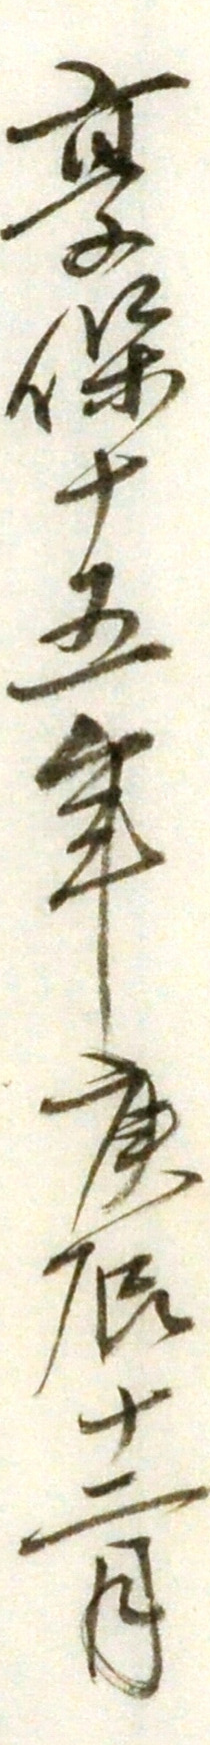享保十五年庚辰十二月
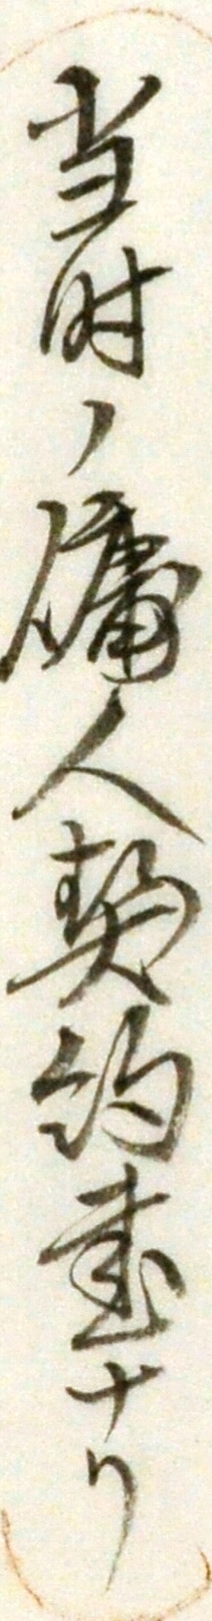当時ノ傭人契約書ナリ
